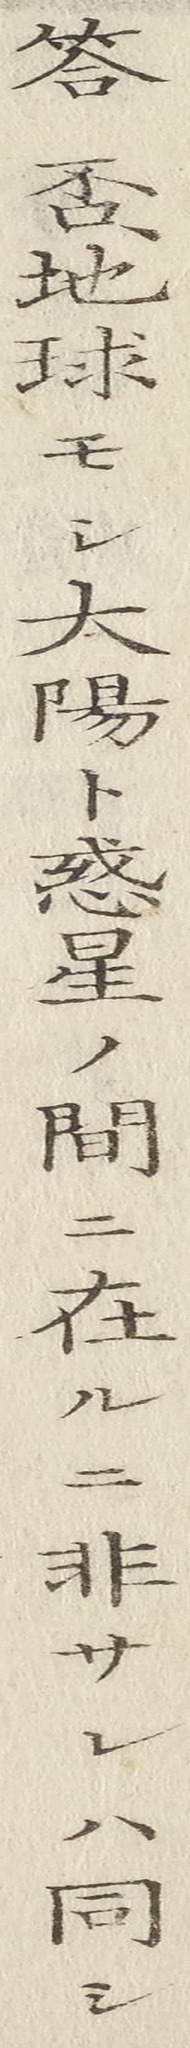答否地球モシ大陽ト惑星ノ間ニ在ルニ非サレハ同シ
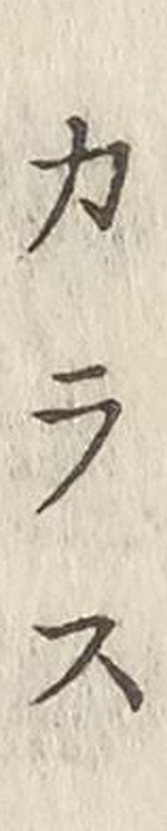カラス
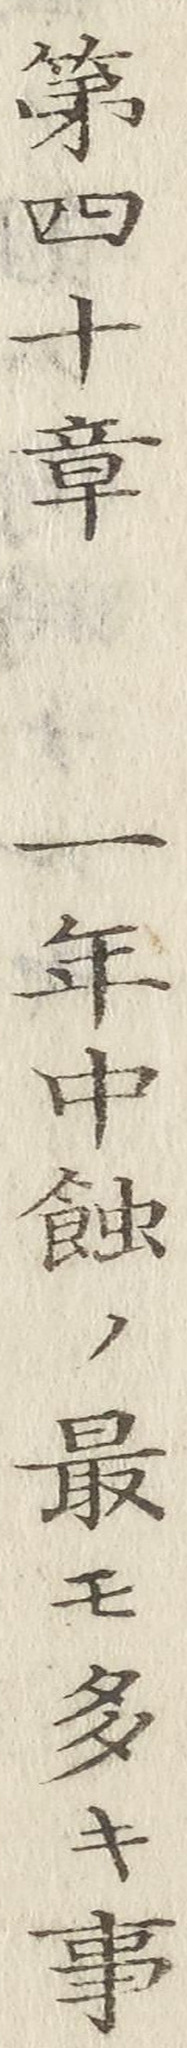第四十章一年中蝕ノ最モ多キ事
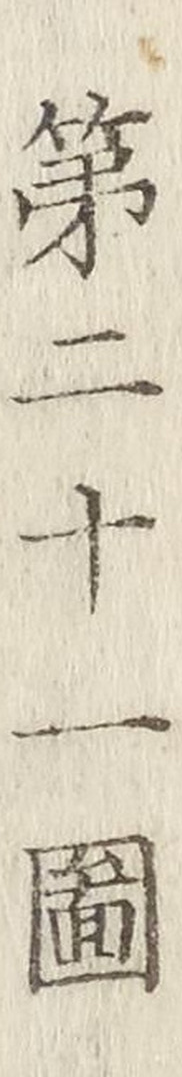第二十一図
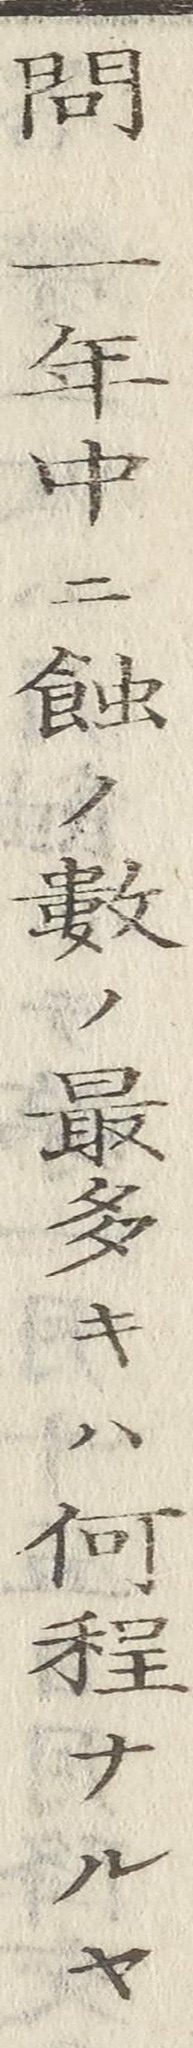問一年中ニ蝕ノ数ノ最多キハ何程ナルヤ
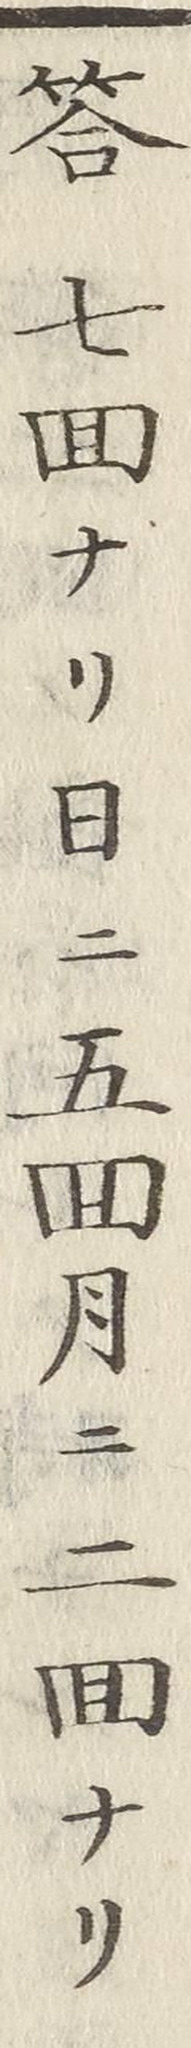答七回ナリ日ニ五回月ニニ回ナリ
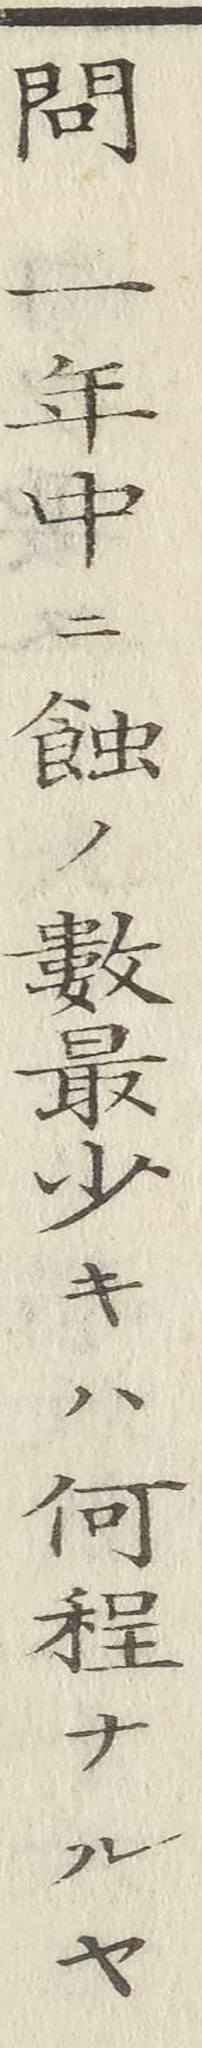問一年中ニ蝕ノ数最少キハ何程ナルヤ
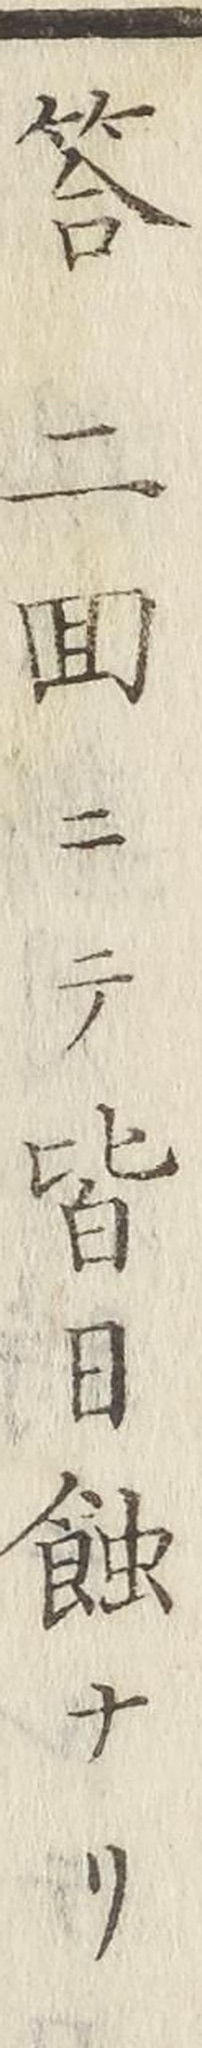答ニ回ニテ皆日蝕ナリ
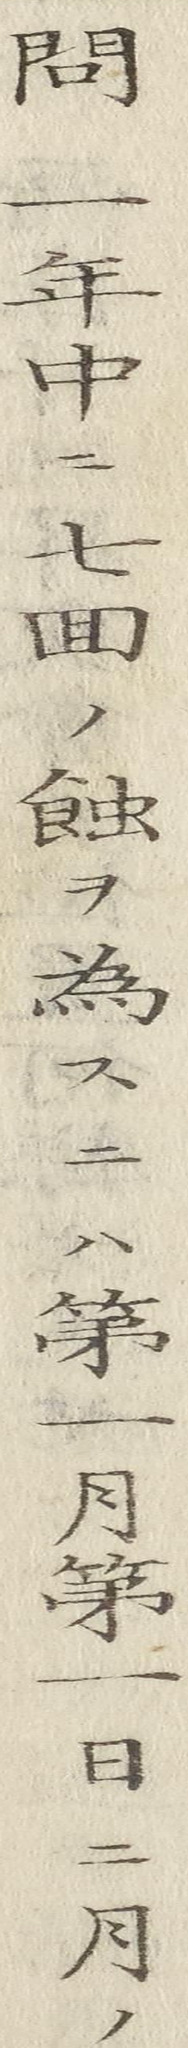問一年中ニ七回ノ蝕ヲ為スニハ第一月第一日ニ月ノ

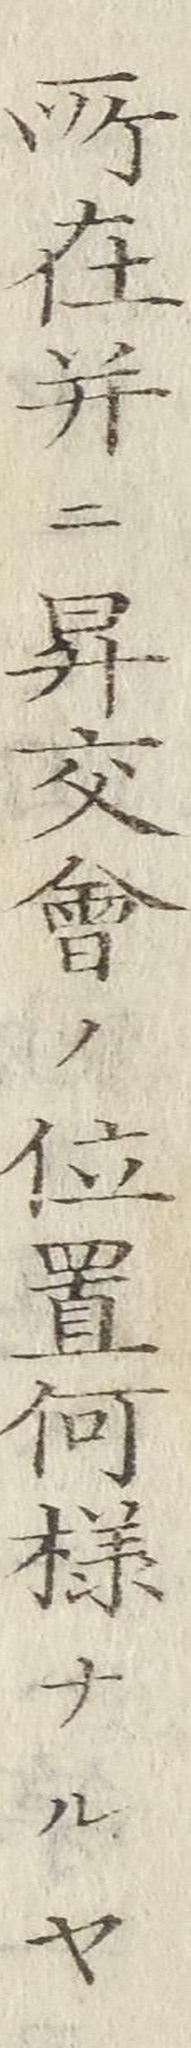所在幷ニ昇交会ノ位置何様ナルヤ
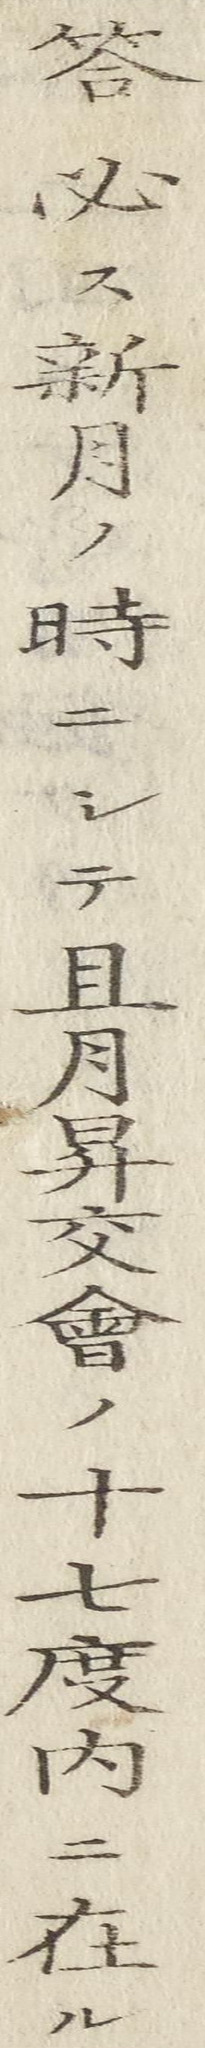答必ス新月ノ時ニシテ且月昇交会ノ十七度内ニ在ル
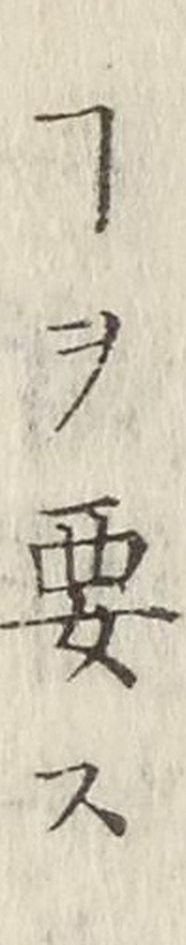コトヲ要ス
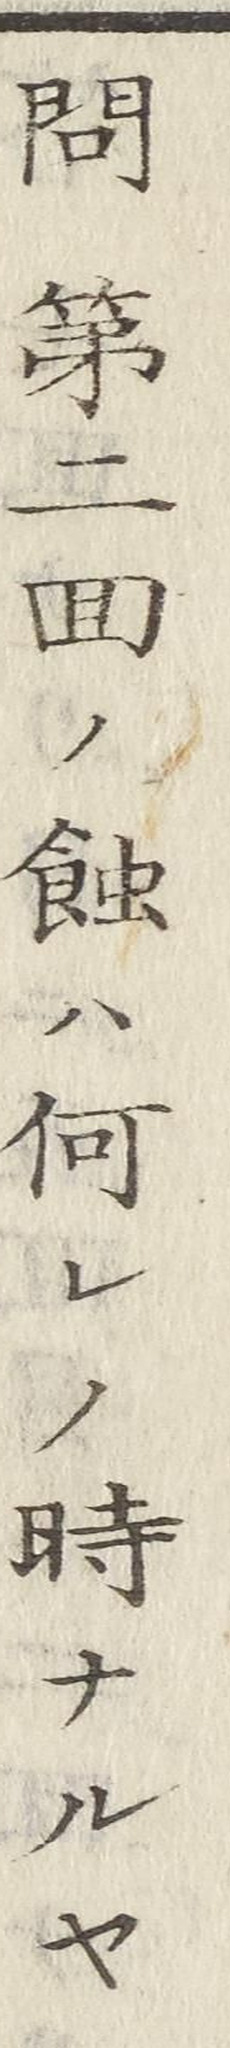問第二回ノ蝕ハ何レノ時ナルヤ
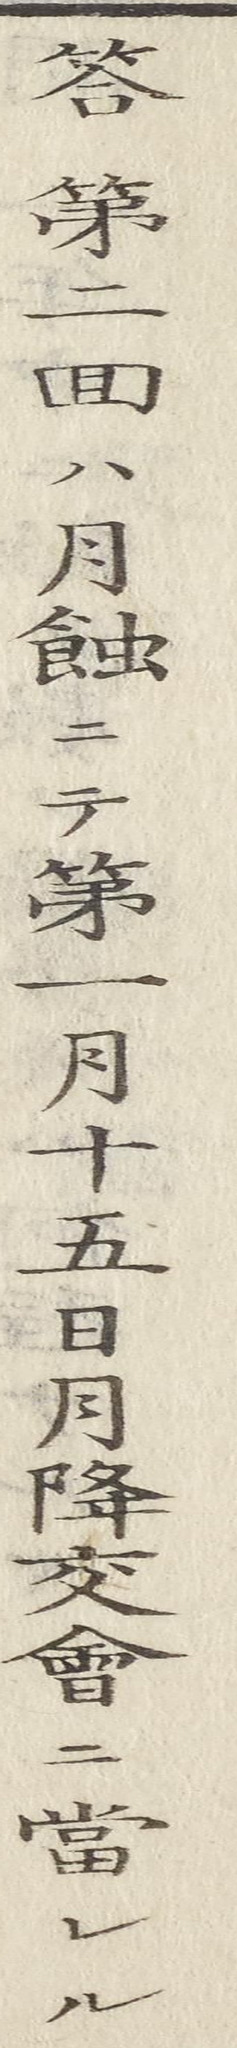答第二回ハ月蝕ニテ第一月十五日月降交会ニ当レル
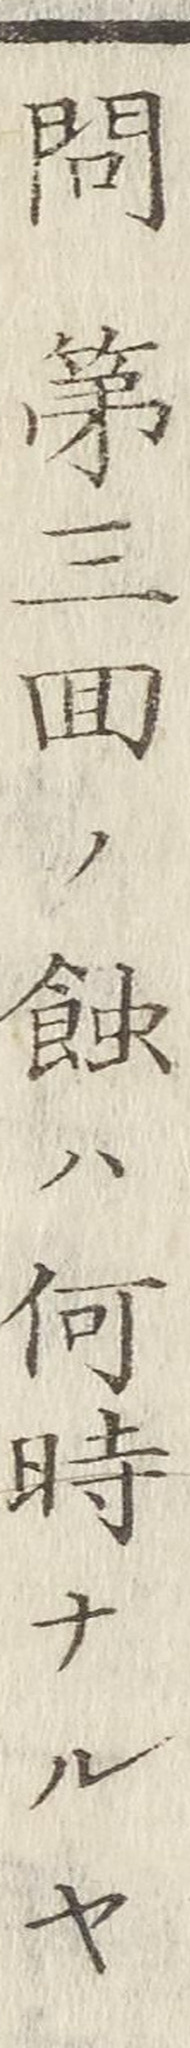問第三回ノ蝕ハ何時ナルヤ
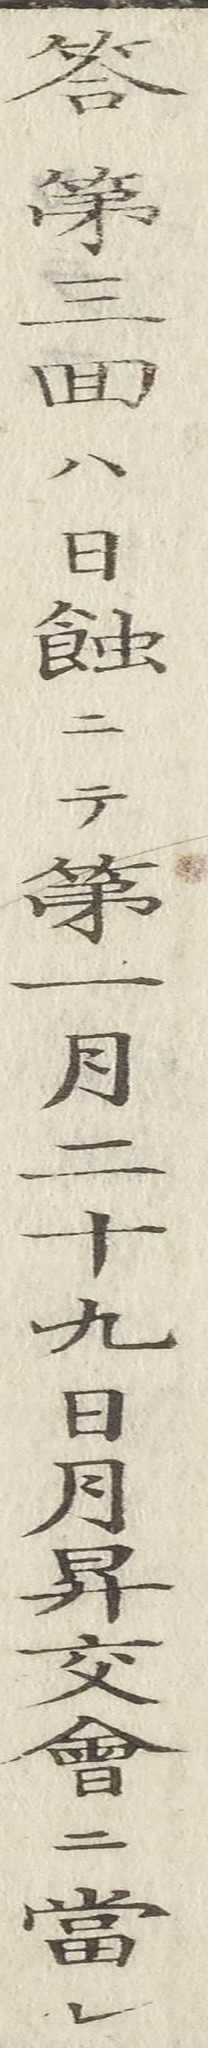答第三回ハ日蝕ニテ第一月二十九日月昇交会ニ当レ
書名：星学圖説　下
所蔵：東京大学地震研究所図書室 Earthquake Research Institute Library, The University of Tokyo, JAPAN
